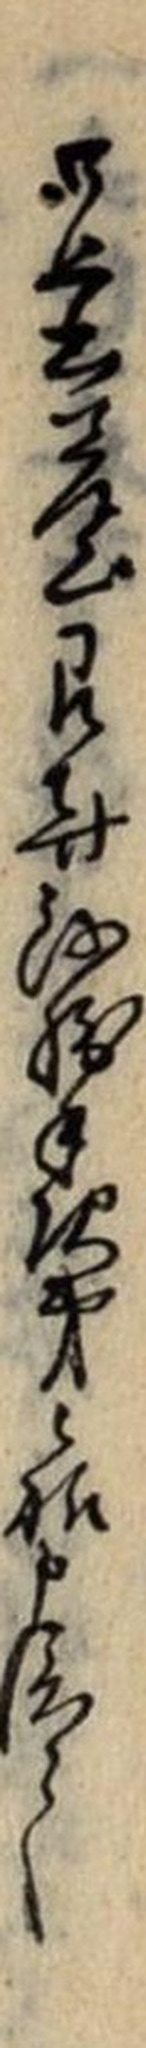口上書差出即刻致勝手次第候様申渡之
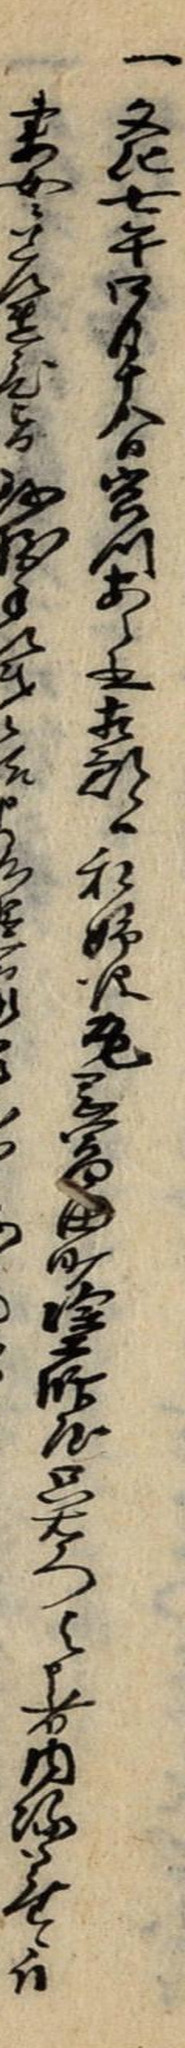一文化七午四月十八日宮川安之丞相願候ハ私姉儀丸岡冨田町塗師屋只右衛門と申者内縁御座候ニ付
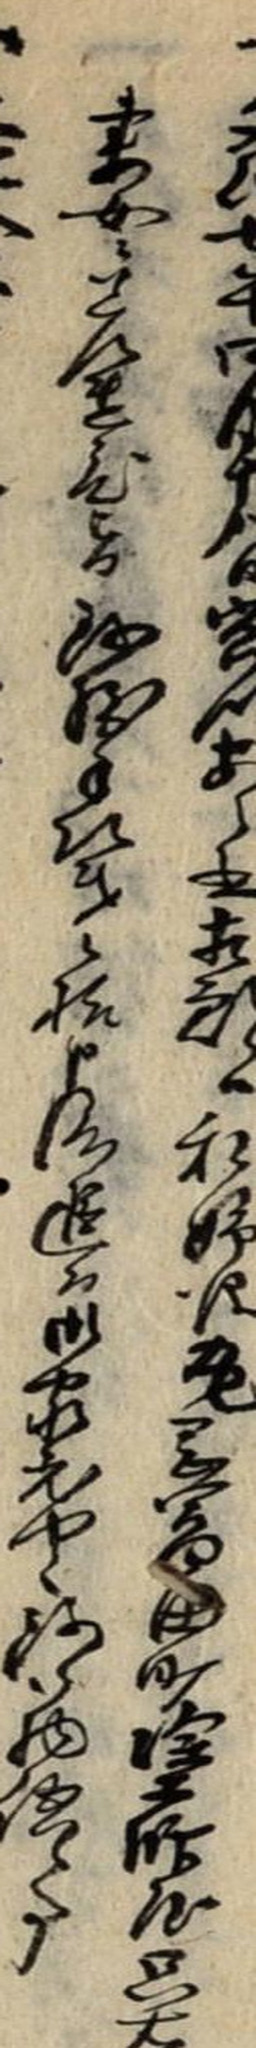妻女ニ差遣度旨致勝手次第候様申渡追而御家老中へ致御物語候事
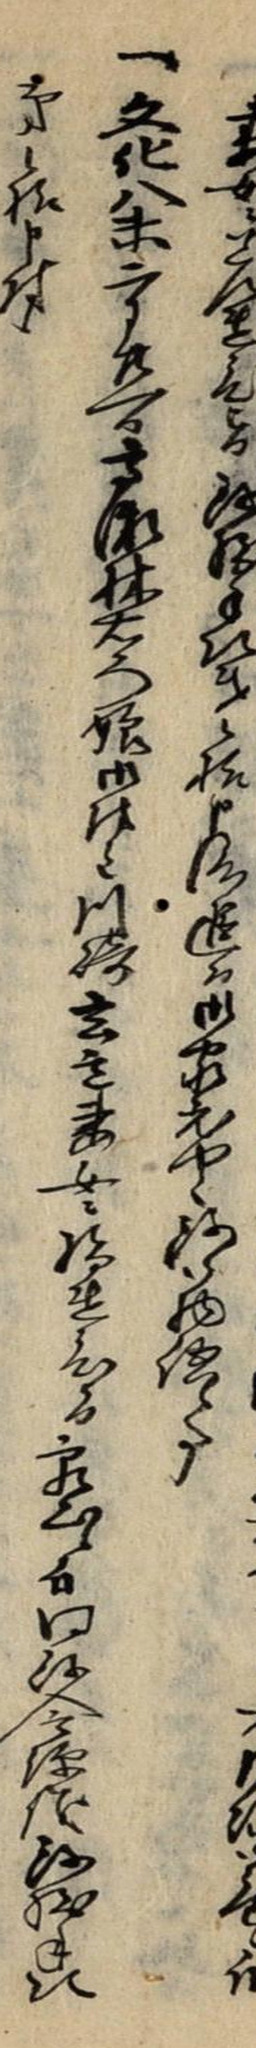一文化八未二月廿一日高瀬林右衛門娘御坊主川崎玄意妻女ニ指遣度旨願出候二付同役令評議致勝手次
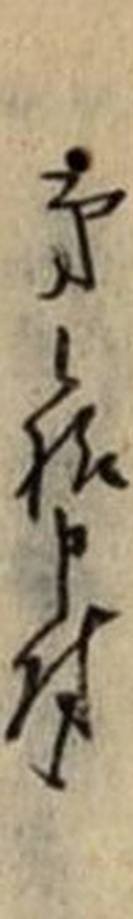第候様申付候
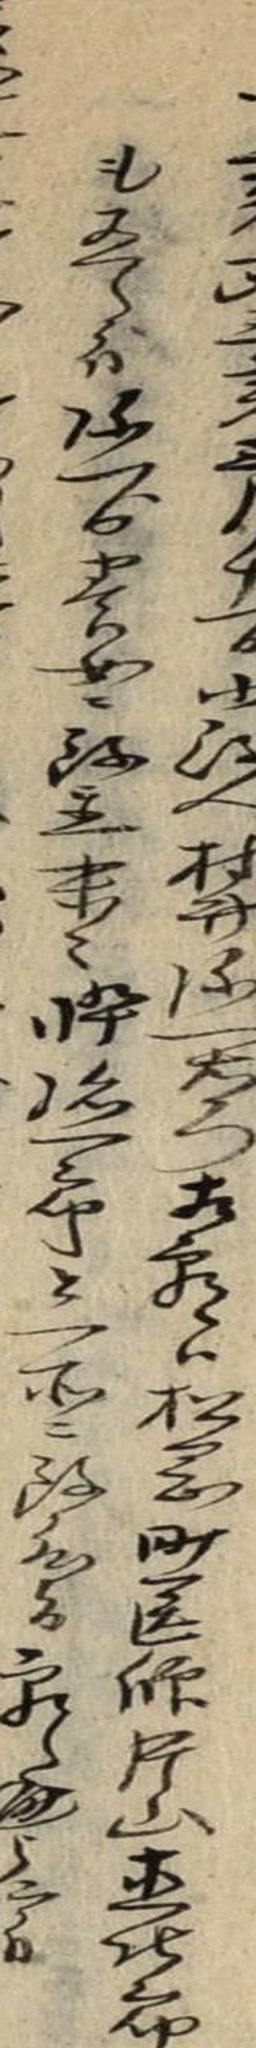も有之ニ付弥一右衛門養女二致置末々悴跡一郎と一所ニ致度旨願之通被仰付
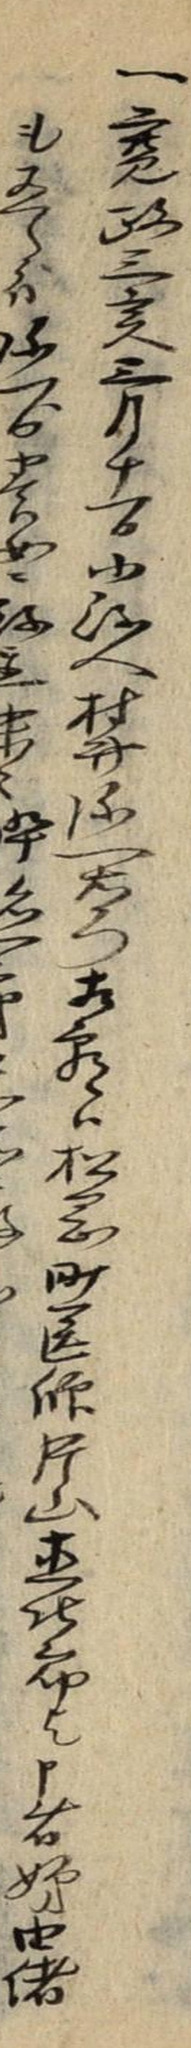一寛政三亥三月十一日小役人村井弥一右衛門相願候ハ松岡町医師片山直次郎与申者姉由緒
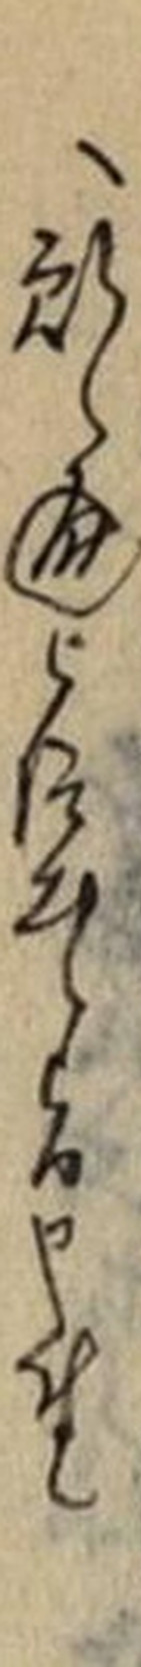へ願之通被仰出候旨申付候
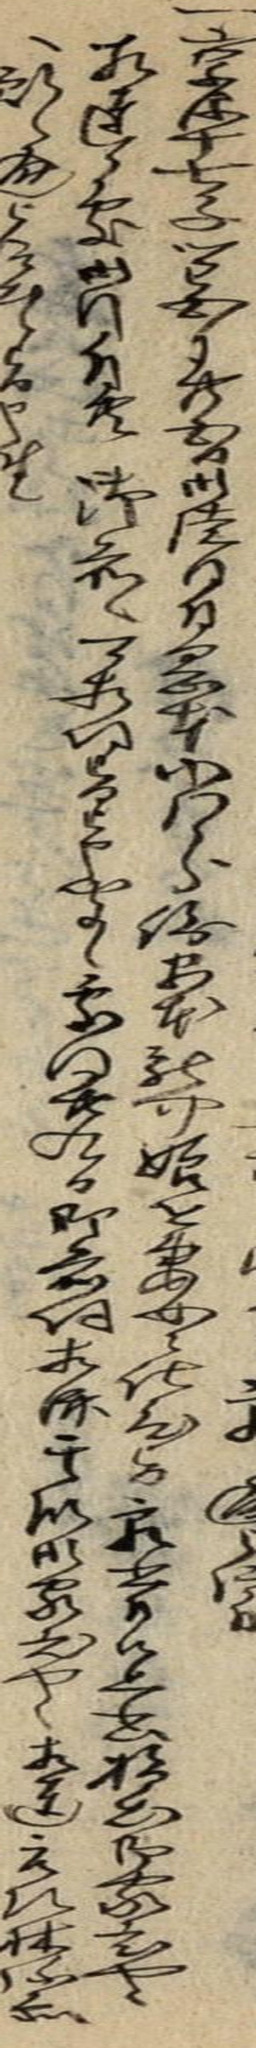相達候処御目付共御前へ可相伺旨被申聞候処同廿九日御前伺相済其段御家老中へ相達取次林弥兵衛

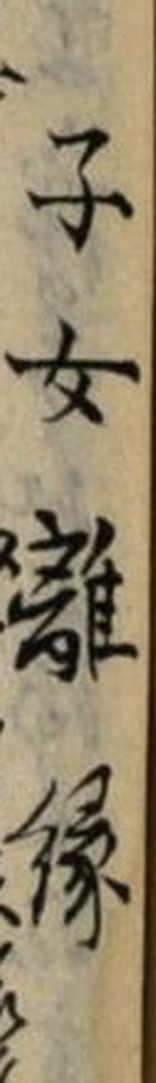子女離縁
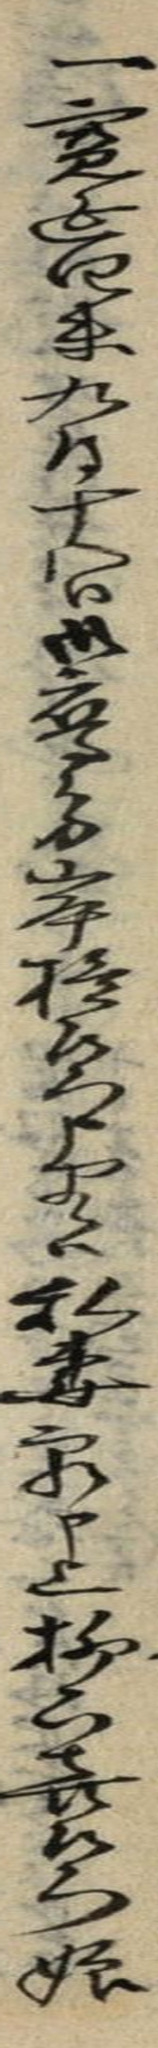一寛延四未九月十八日御鷹方岸権左衛門申聞候ハ私妻願申上柳下喜左衛門娘
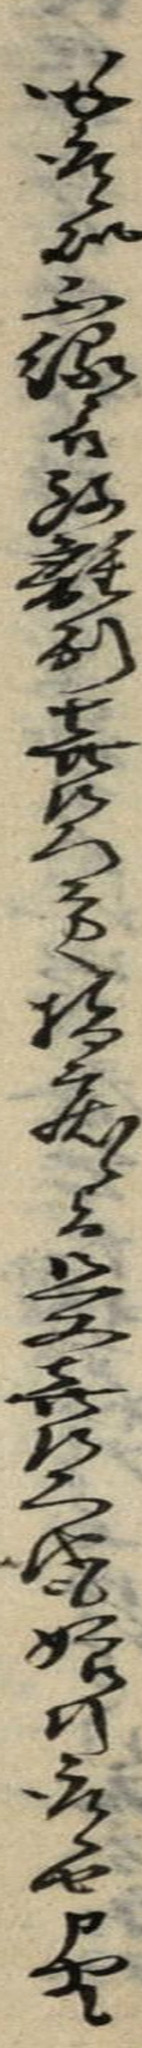呼取候処不縁ニ付致離別喜左衛門方へ指戻候旨且又喜左衛門儀も娘引取候由申聞候
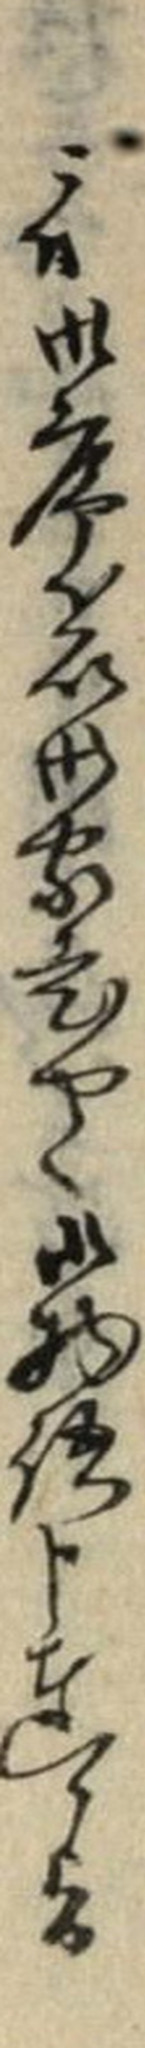ニ付御序を以御家老中へ御物語申達候旨
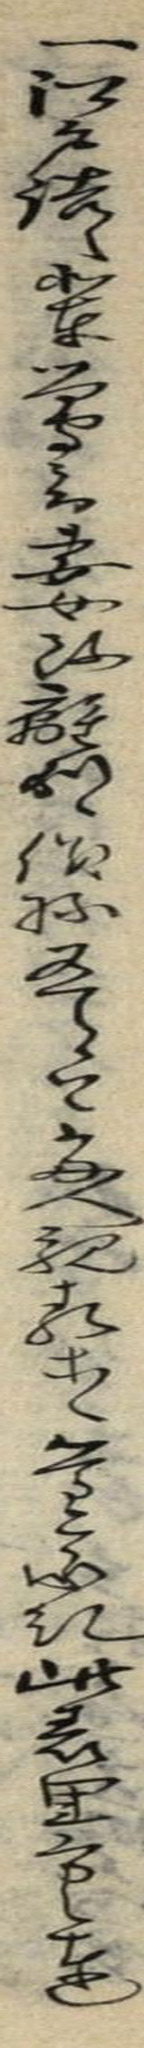一江戸詰之輩留守ニ而妻女致離別候儀抔有之候ハヽ当人親類等へ篤と承糺此表里方へ達
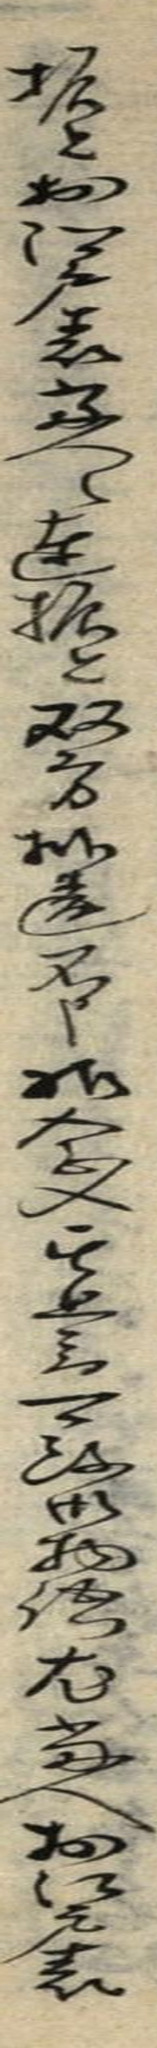振と於江戸表当人之達振と双方掛違不申様念入其上ニ而可致御物語尤当人於江戸表
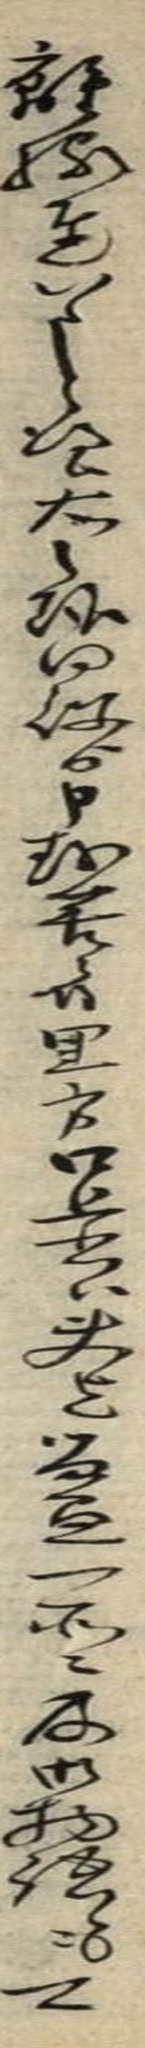離縁達いたし候得ハ右之趣同役ゟ申越筈二付里方口上書は夫迄留置一所ニ及御物語候も可
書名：養子縁組之部
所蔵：福井県文書館 Fukui Prefectural Archives
